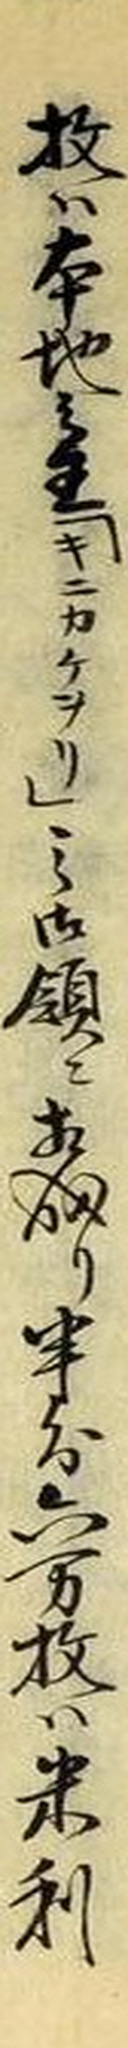枚ハ本地之主「キニカケヲリ」之御領ニ相成り半分六万枚ハ米利
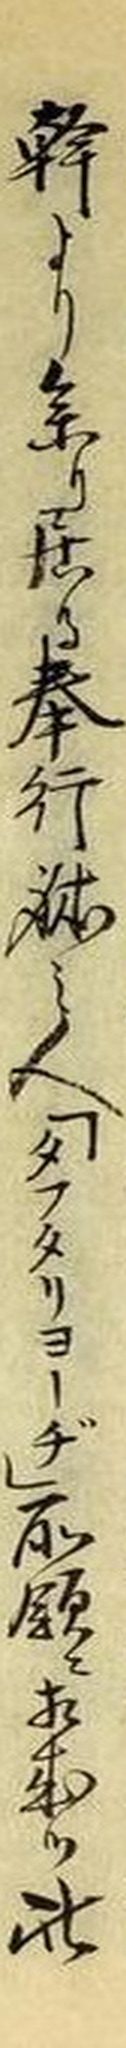幹より参り居る奉行躰之人「タフタリヨーヂ」所領ニ相成り此
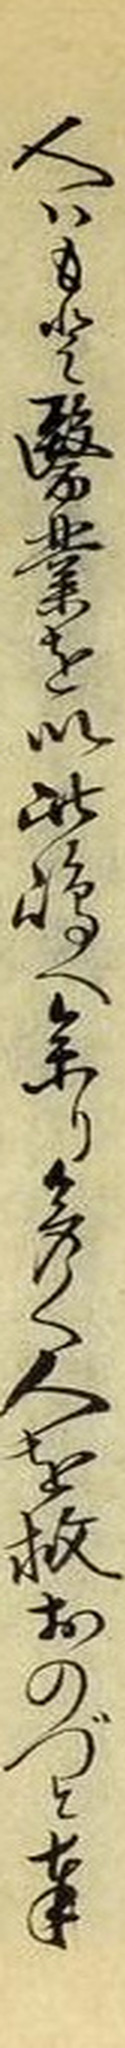人ハもと医業を以此の嶋へ参り多く人を救おのづと奉
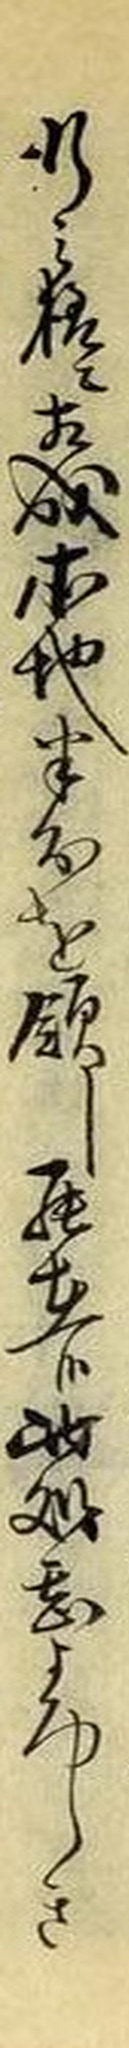行之様ニ相成本地半分を領し罷在候此処甚よろしき
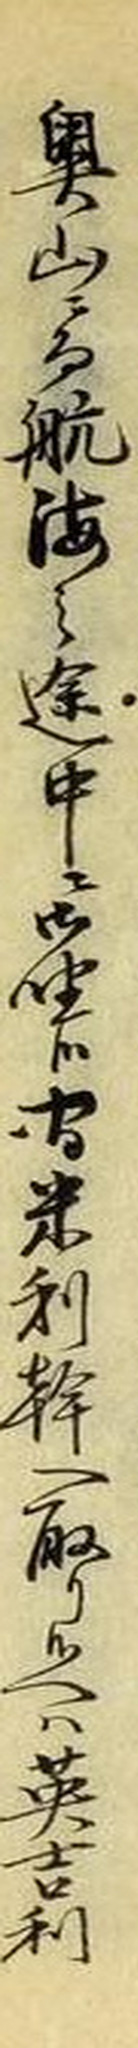奥山ニ而航海之途中ニ御座候間米利幹へ取り候へハ英吉利
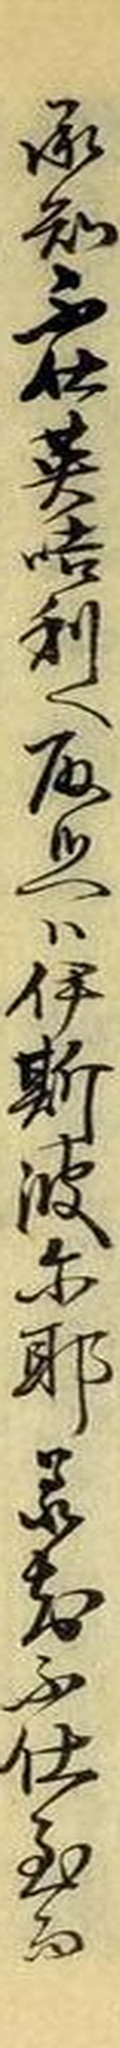承知不仕英吉利へ取候へハ伊斯波尓耶承知不仕至而
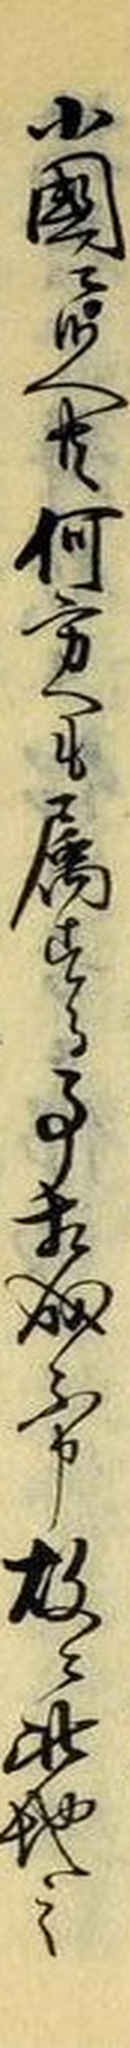小国ニ候へ共何方へも属する事相成不申故ニ此地之
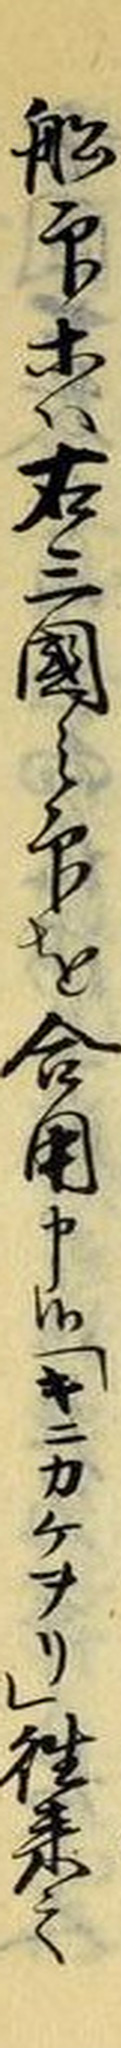船印等ハ右三国之印を合用申候「キニカケヲリ」往来之
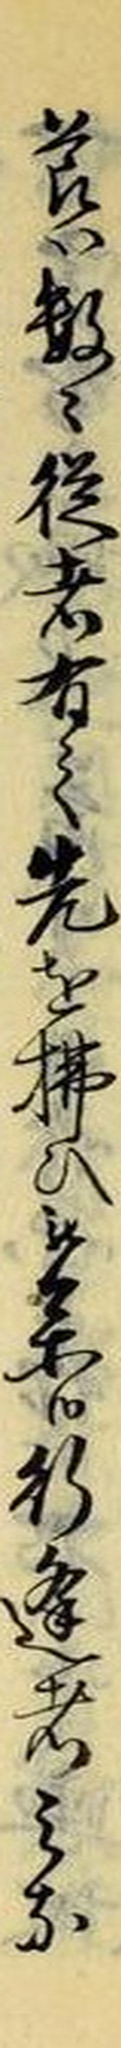節ハ数々徒者有之先を払被參候行逢者之ミな
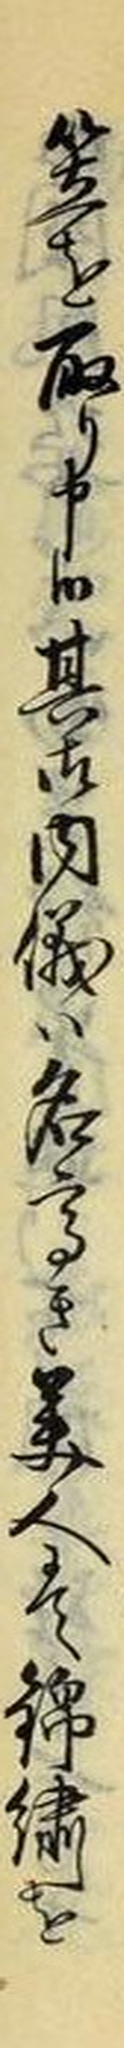笠を取り申候其御内儀ハ名高き美人にて錦繍を
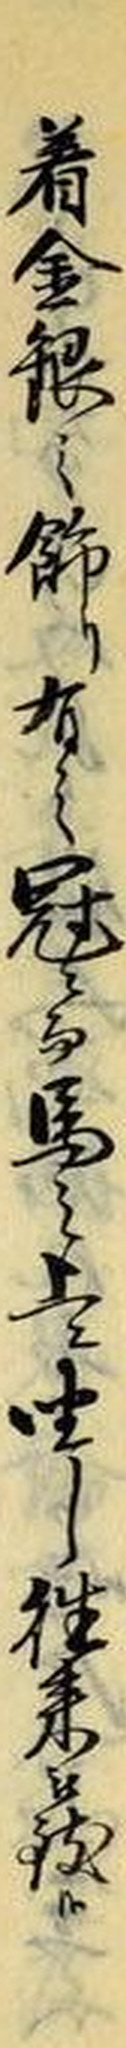着金銀之飾り有之冠ニ而馬之上ニ坐し往来被致候
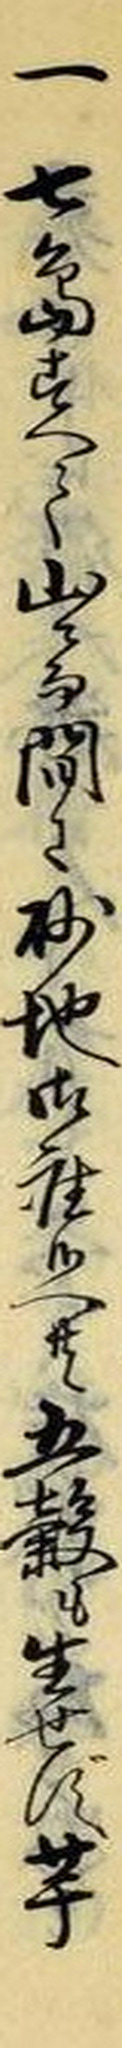一七島すへて山ニ而間に砂地御座候へ共五穀も生せず芋
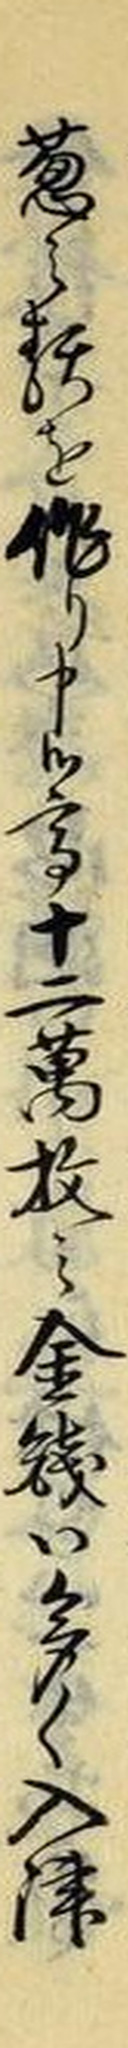葱の類を作り申候高十二万枚之金銭ハ多く入津
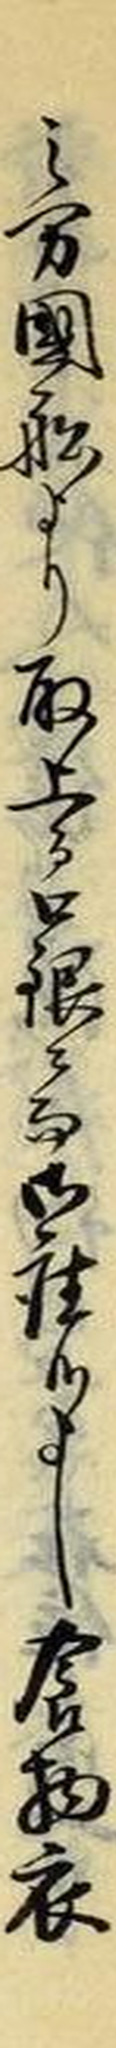之万国船より取上る口銭ニ而御座候よし食物衣
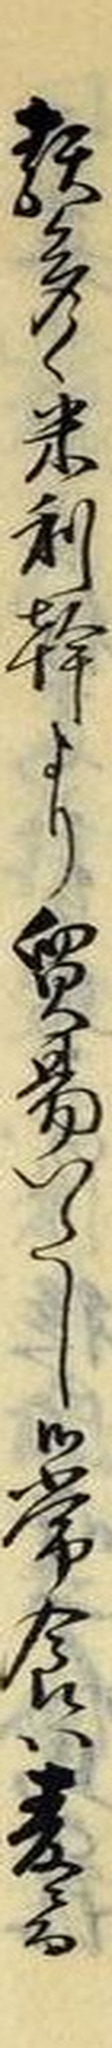類多く米利幹より貿易いたし候常食ハ麦ニ而
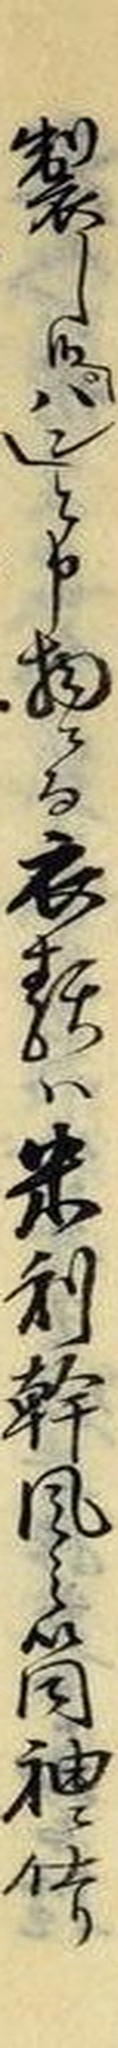製し候「パン」と申物ニ而衣類ハ米利幹風之筒袖ニ仕り
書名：漂客談奇（備考雑録写8）
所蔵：福井県文書館 Fukui Prefectural Archives
